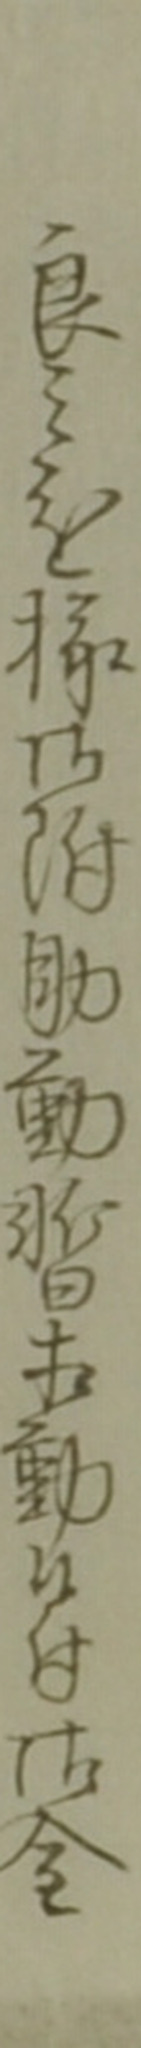良之進様御附助勤暫相勤候付御金
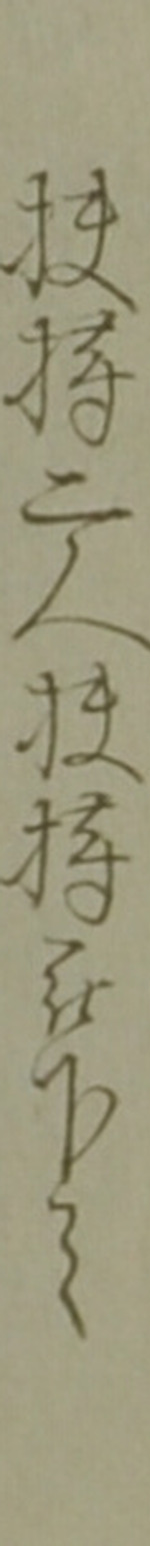扶持二人扶持被下之
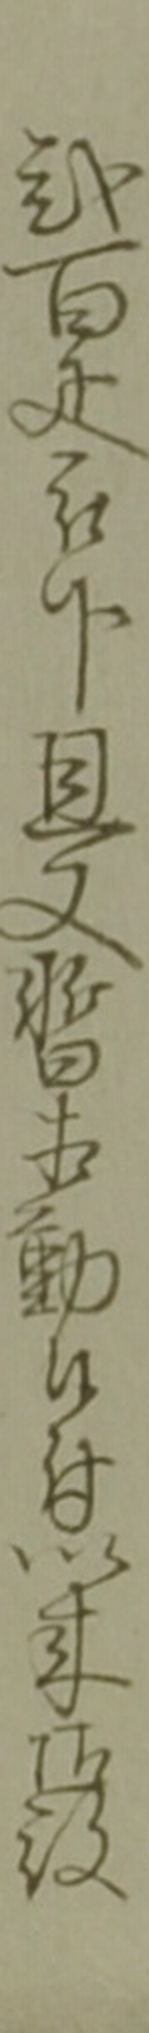弐百疋被下且又暫相勤候付以来御役
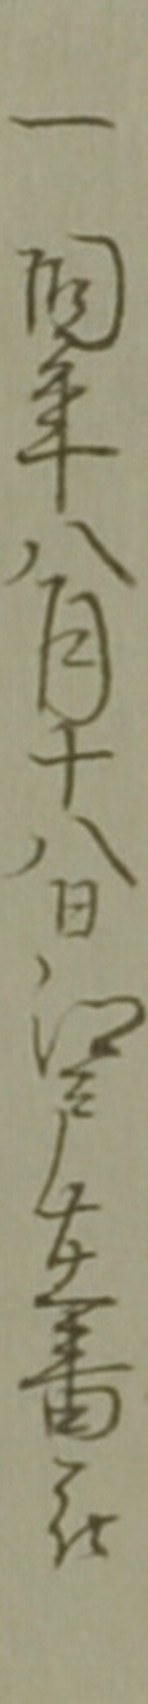一同年八月十八日江戸在番被
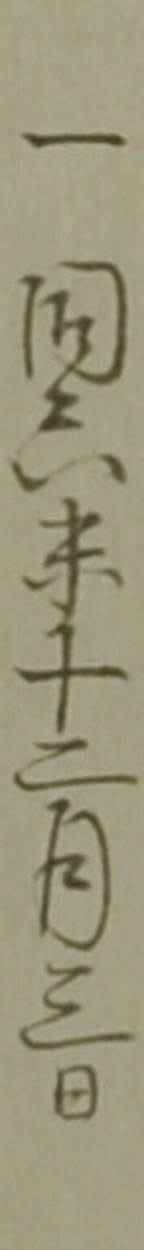一同六未十二月三日
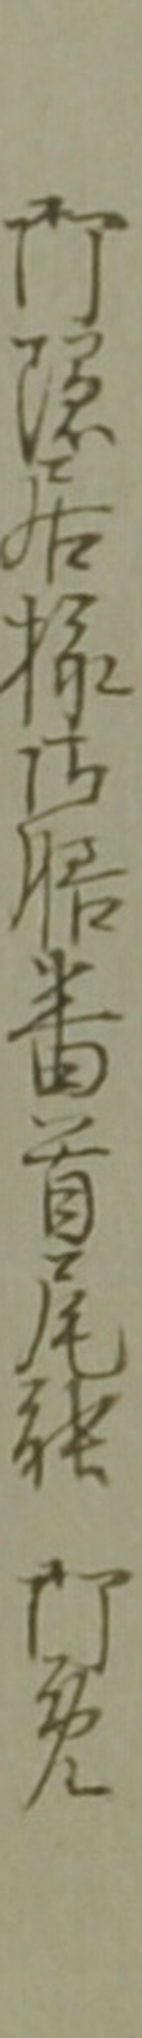御隠居様御膳番首尾能御免

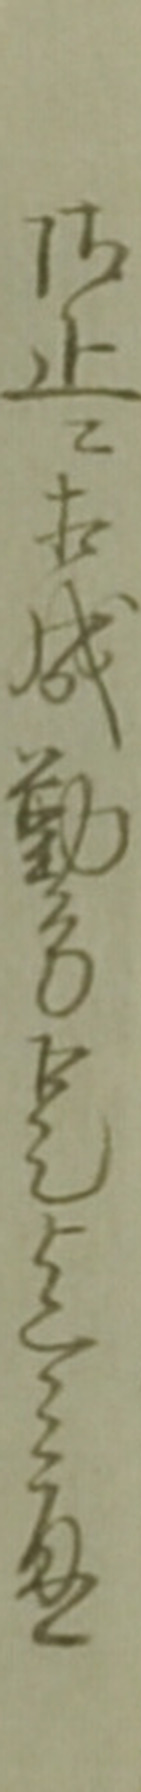相止ニ相成勤方是迄之通
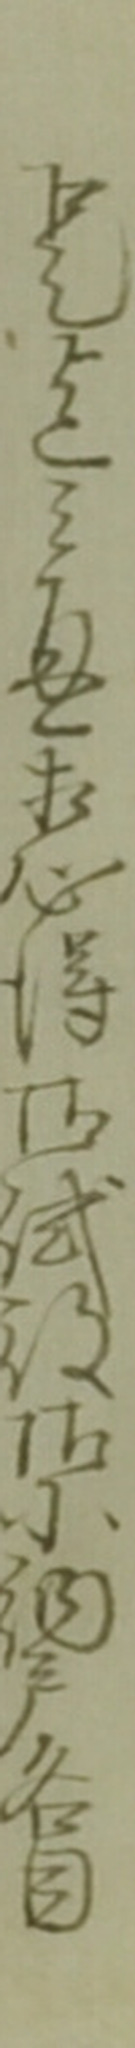是迄之通相心得御試役御小納戸名目
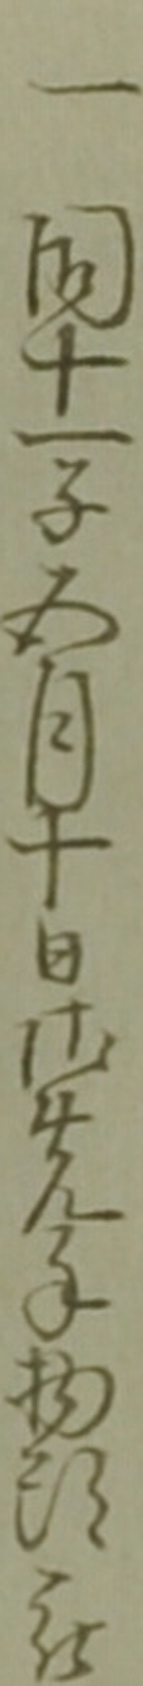一同十一子五月十日御先手物頭被
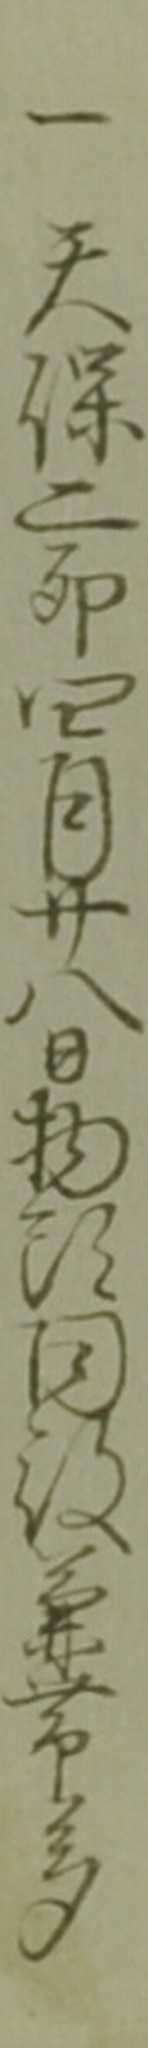一天保二卯四月廿八日物頭同役兼帯多
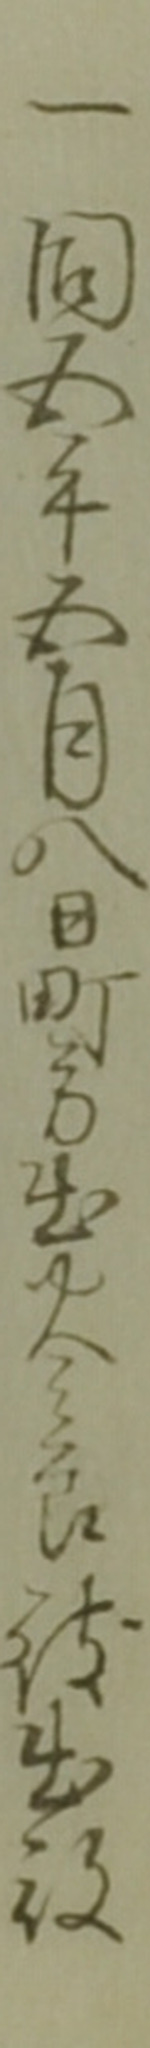一同五午五月八日町方出火之節致出役
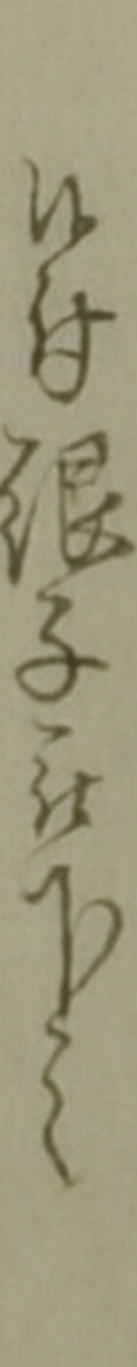候付銀子被下之
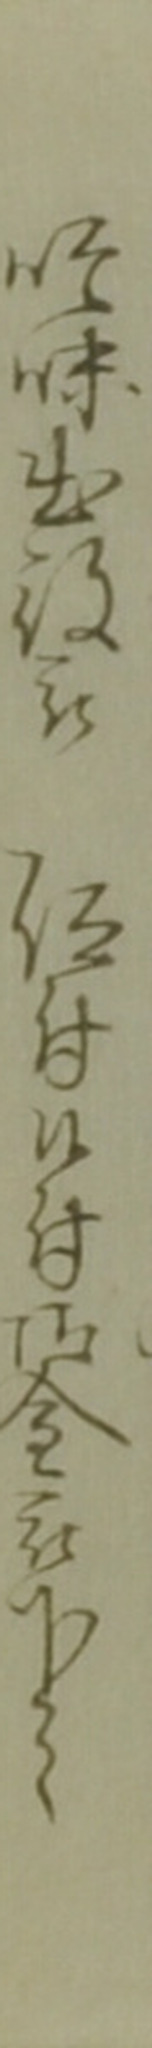吟味出役被仰付候付御金被下之
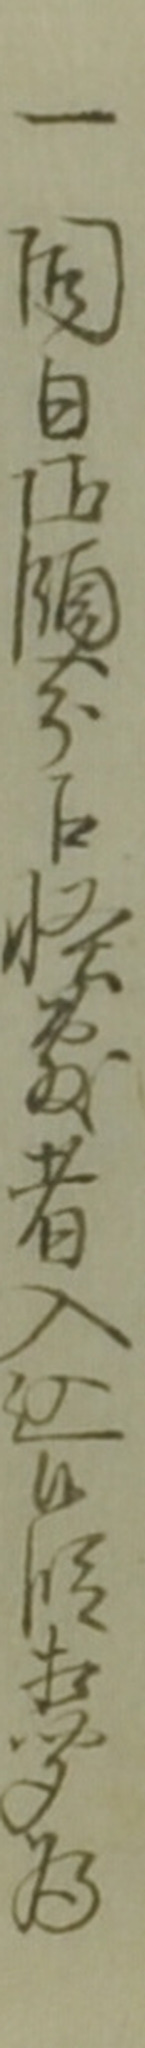一同日御領分え怪敷者入込候段相聞為
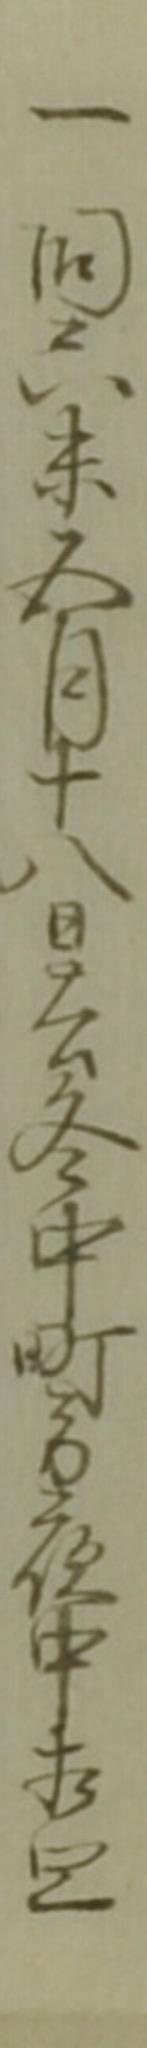一同六未五月十八日去冬中町方夜中相廻
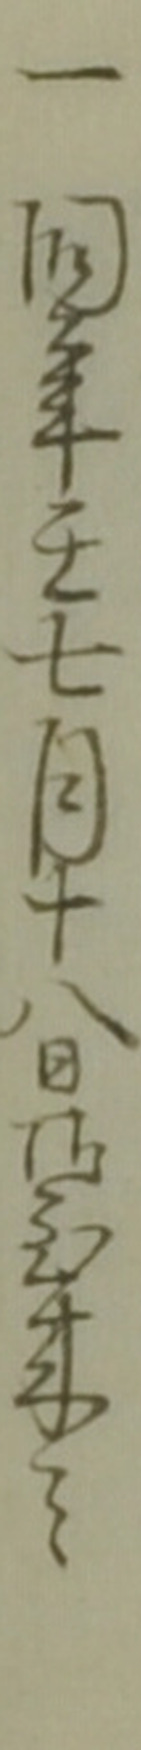一同年閏七月十八日御到来之
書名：給人諸士勤仕録（三）
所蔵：伊那市立高遠町図書館・合同会社AMANE
